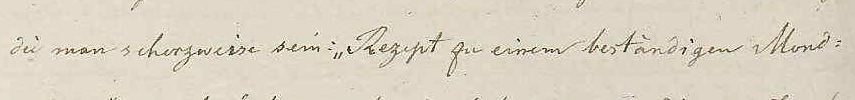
die man scherzweise sein: „Rezept zu einem beständigen Mond-
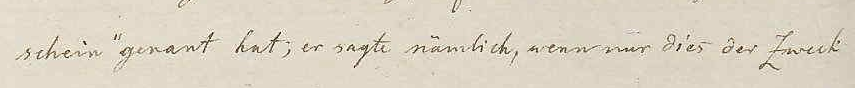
schein” genant hat; er sagte nämlich, wenn nur dies der Zweck
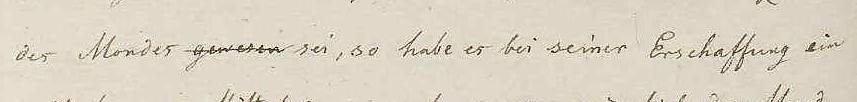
des Mondes gewesensei, so habe es bei seiner Erschaffung ein
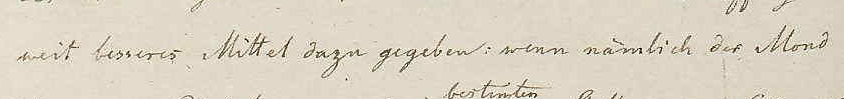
weit besseres Mittel dazu gegeben: wenn nämlich der Mond
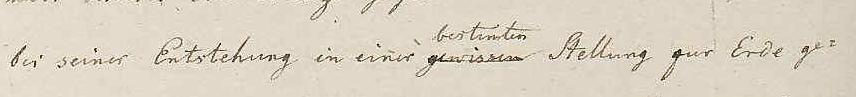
bei seiner Entstehung in einer gewissenbestimten Stellung zur Erde ge-
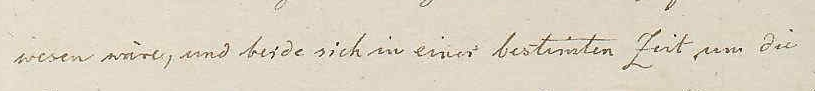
wesen wäre, und beide sich in einer bestimten Zeit um die
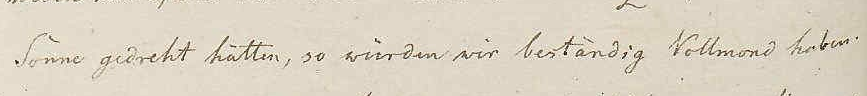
Sonne gedreht hätten, so würden wir beständig Vollmond haben.
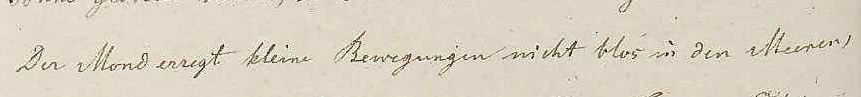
Der Mond erregt kleine Bewegungen nicht blos in den Meeren,
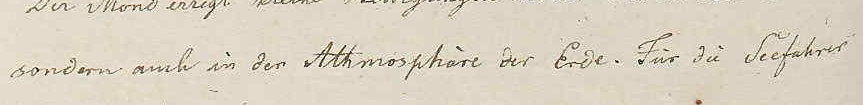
sondern auch in der Athmosphäre der Erde. Für die Seefahrer
